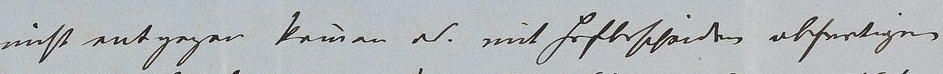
nicht entgegen kommen od. mit Hofbescheiden abfertigen
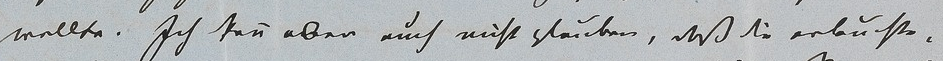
wollte. Ich kann aber auch nicht glauben, daß die erlauchte-
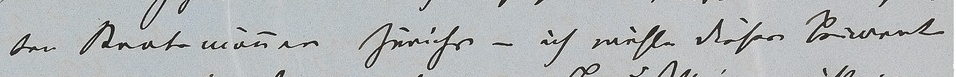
sten Staatsmänner Zürichs – ich wähle dieses Beiwort
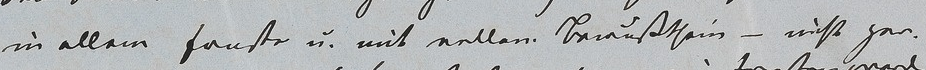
in allem Ernste u. mit vollem Bewußtsein – nicht ger-
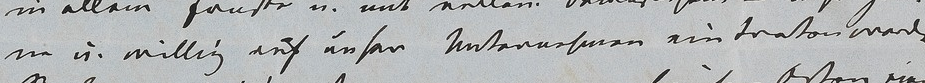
ne u. willig auf unser Unternehmen eintreten werden.
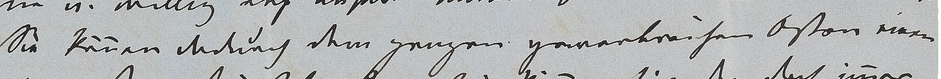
Sie können dadurch dem ganzen gewerbreichen Osten einen
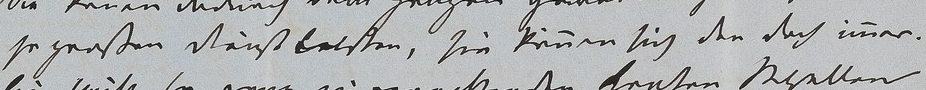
so großen Dienst leisten, sie können sich den doch immer-
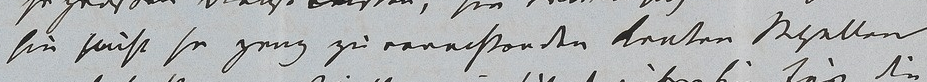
hin nicht so ganz zu verachtenden Kanton St Gallen
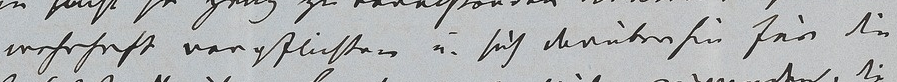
wahrhaft verpflichten u. sich darüberhin für die
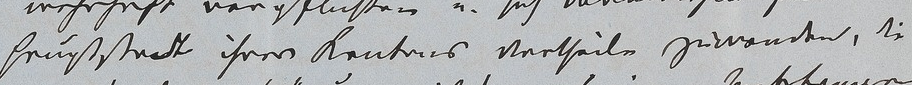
Hauptstadt ihres Kantons Vortheile zuwenden, die
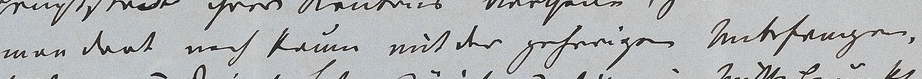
man dort noch kaum mit der gehörigen Unbefangen-
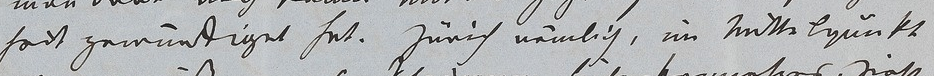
heit gewürdiget hat. Zürich nämlich, im Mittelpunkt
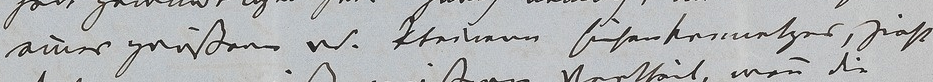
eines größern od. kleinern Eisenbahnnetzes, zieht
